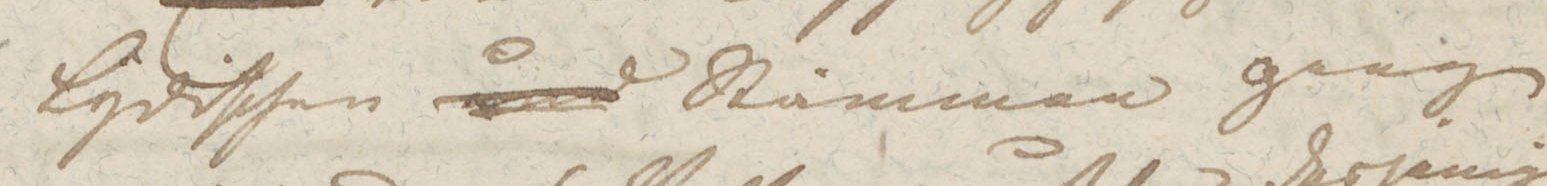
Lydischen und Stämmen ganz
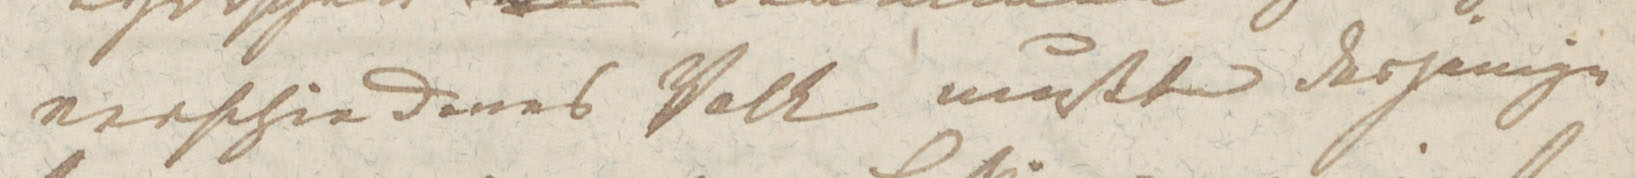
verschiedenes Volk musste dasjenige
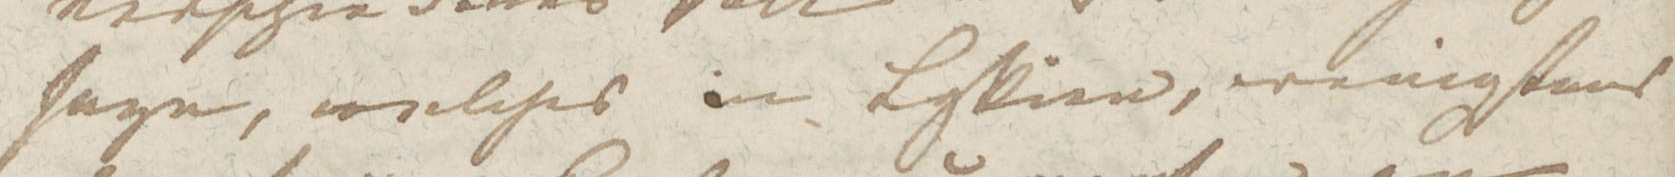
seyn, welches in Lykien, wenigstens
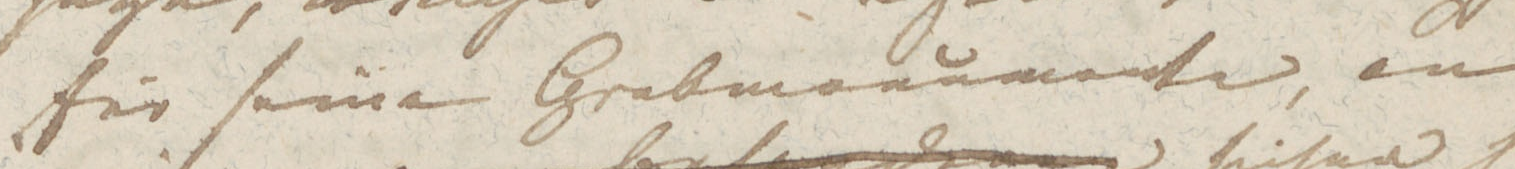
für seine Grabmonumente, an
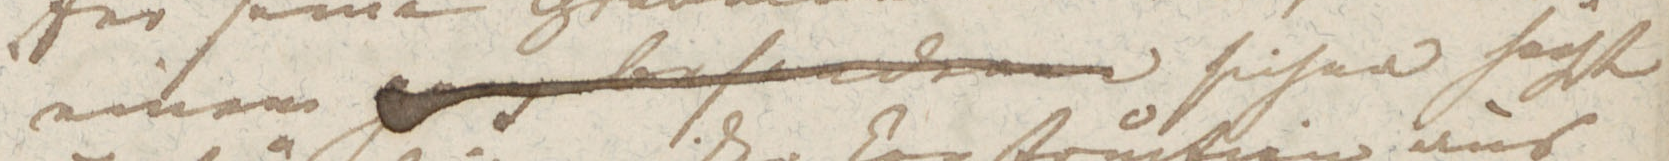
einem ganz besonderen sicher höchst
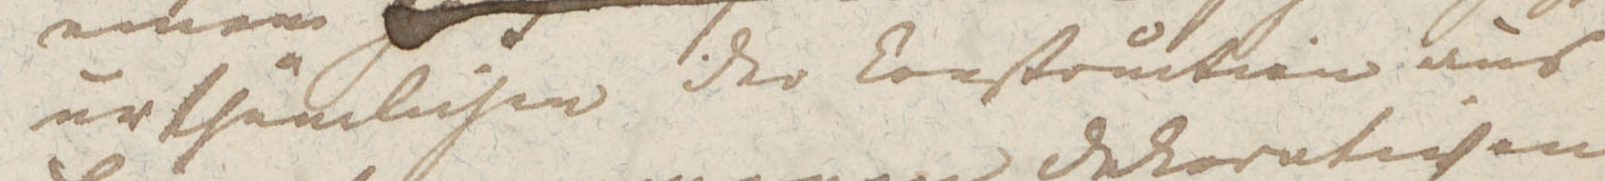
urthümlichen der Construction aus
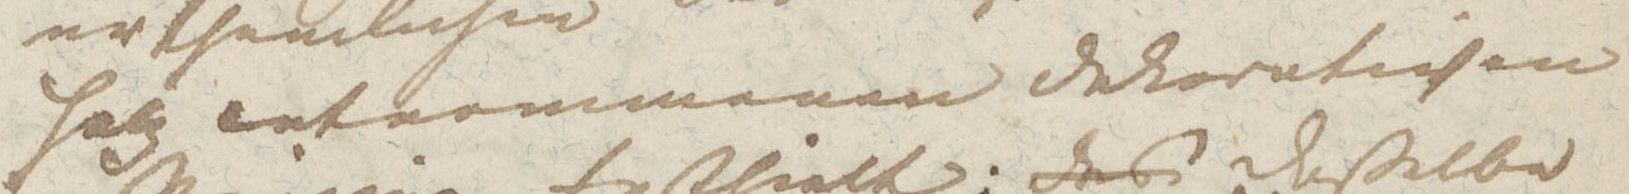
Holz entnommenen dekorativen
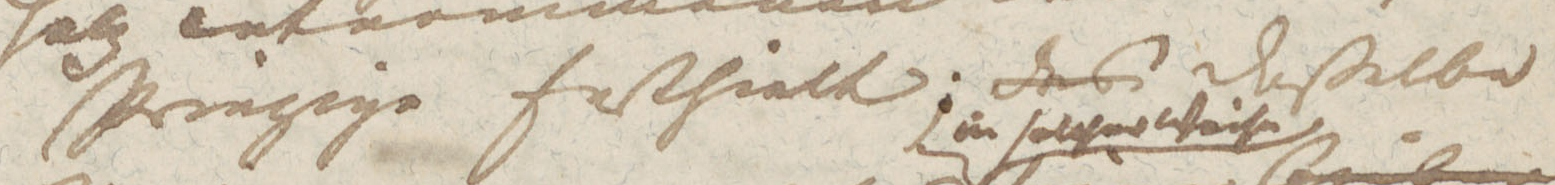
Prinzipe festhielt; das Dasselbe
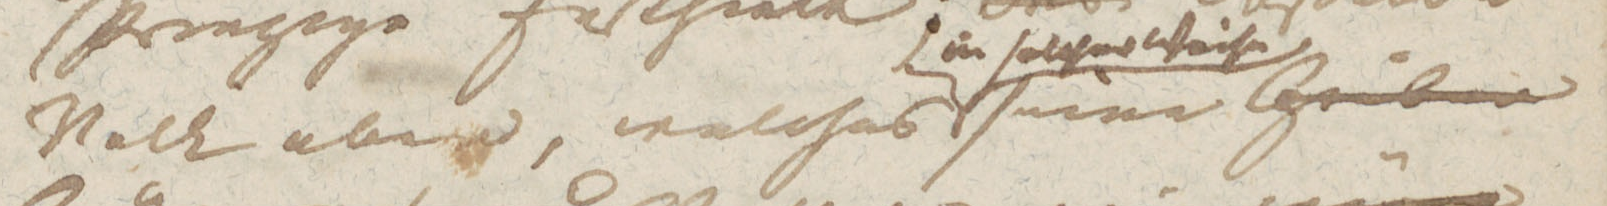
Volk aber, welches in solcher Weise seine
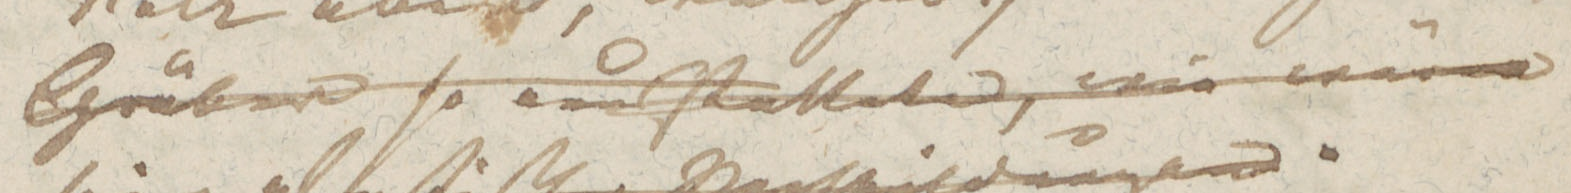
Gräber so ausstattete, wie wären
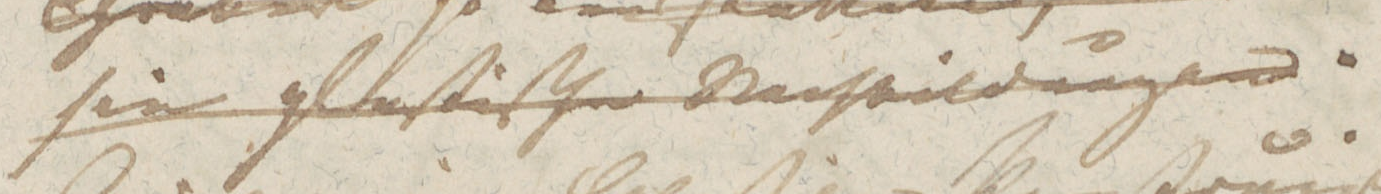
sie plastischer Nachbildungen.
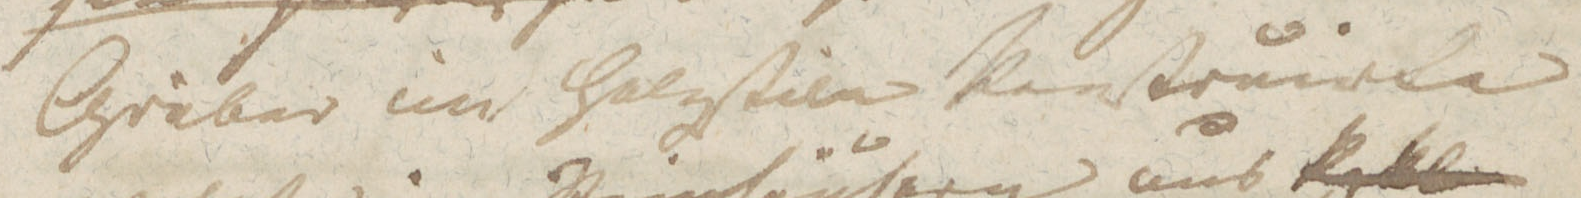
Gräber im Holzstile konstruirte
